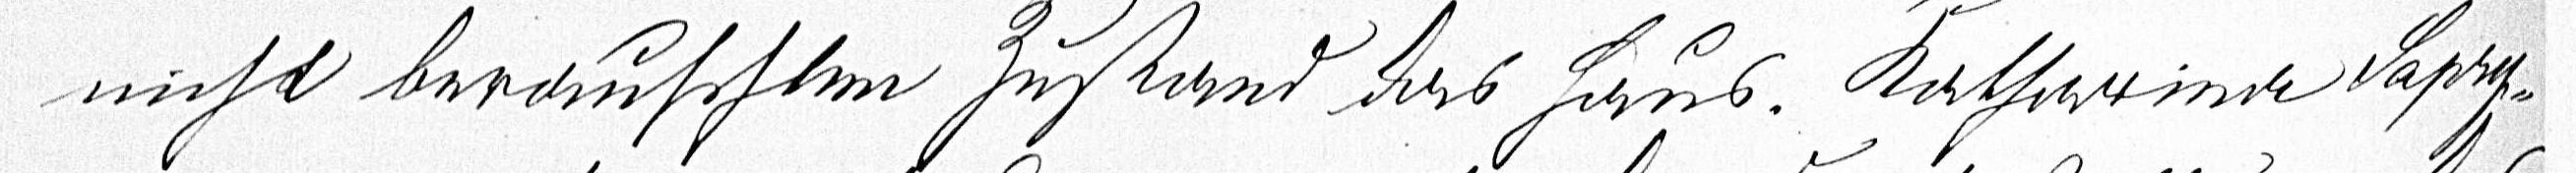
nicht berauschten Zustand das Haus. Katharina Sapry¬
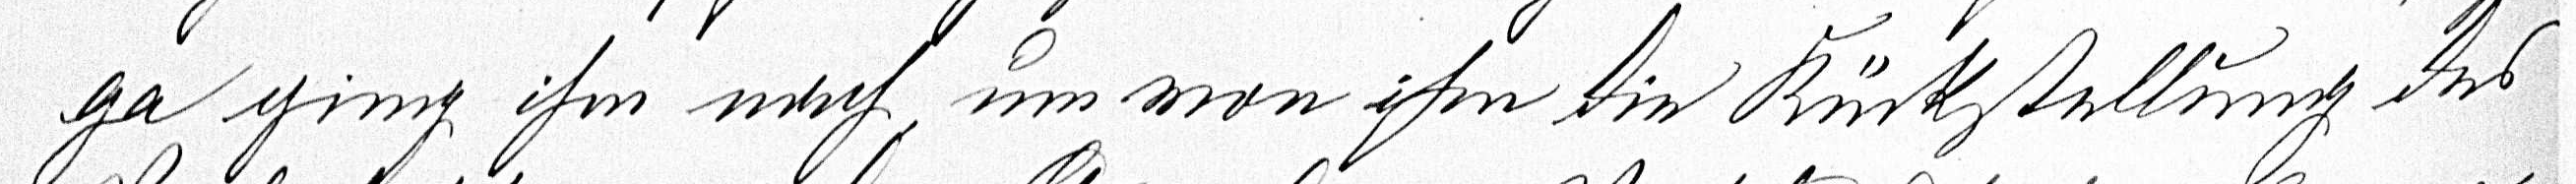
ga ging ihm nach um von ihm die Rückstattung des
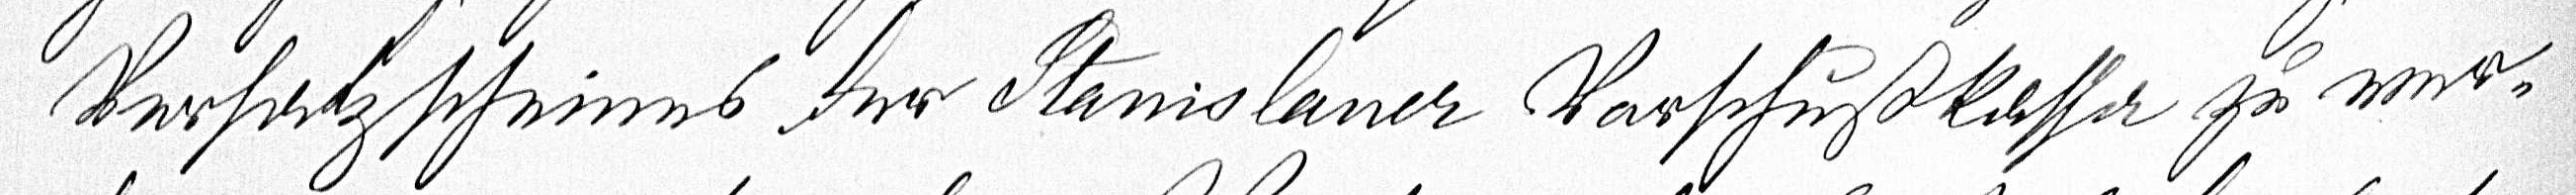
Barsatzscheines der Stanislauer Vorschußkassa zu ver¬
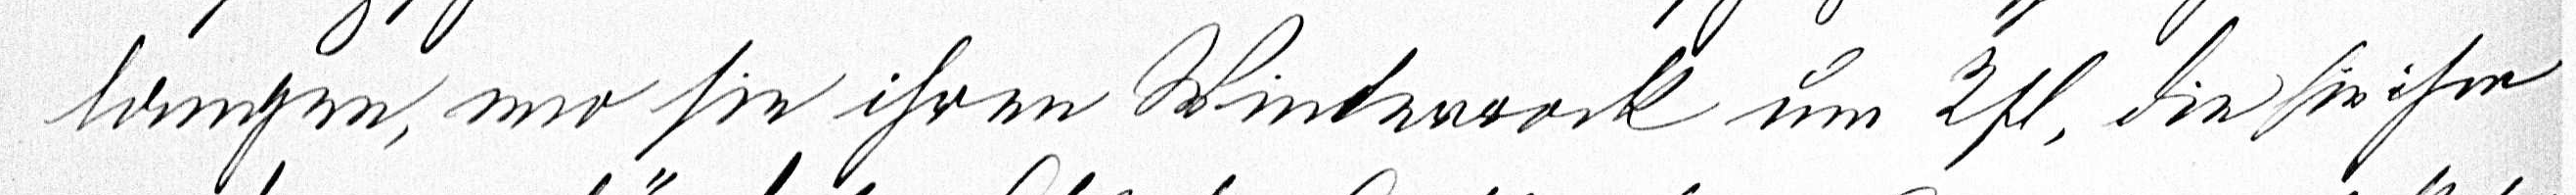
langen, wo sie ihren Winterrock um 3fl, die sie ihm
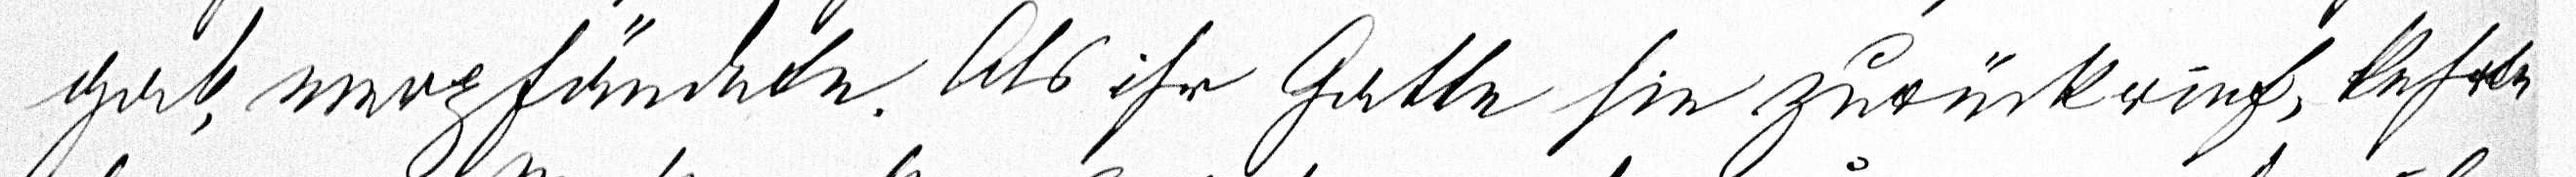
gab, verpfändete. Als ihr Gatte sie zurückrief, kehrte
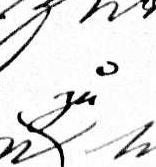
zu
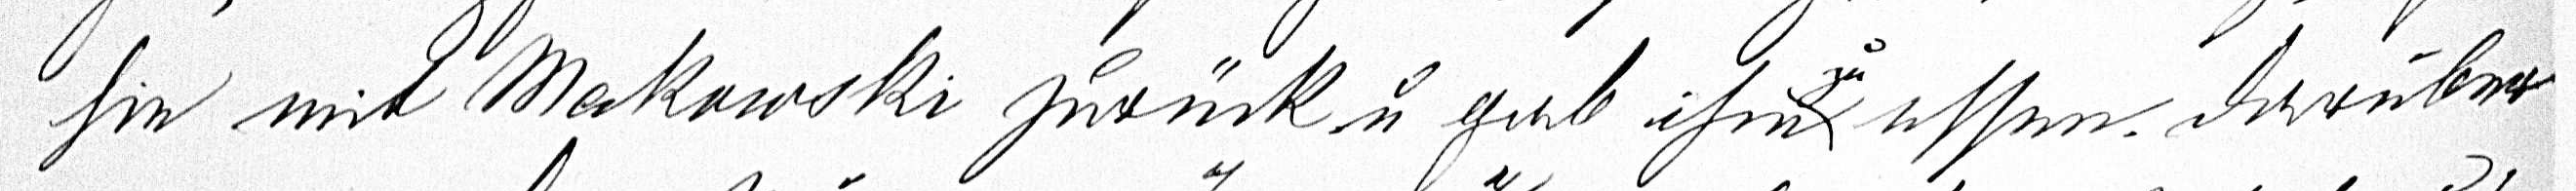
sie mit Makowski zurück u gab ihm essen. Darüber
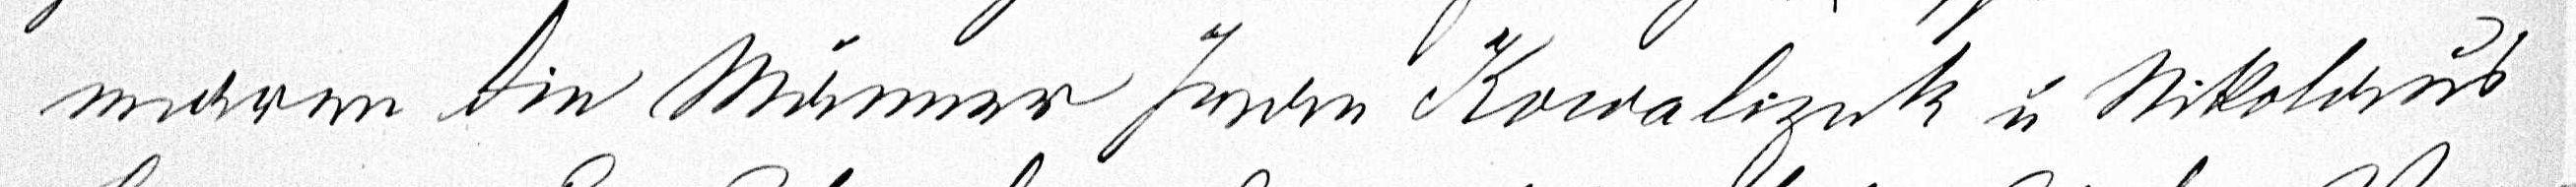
waren die Männer Iwan Kowalczu, u Nikolaus
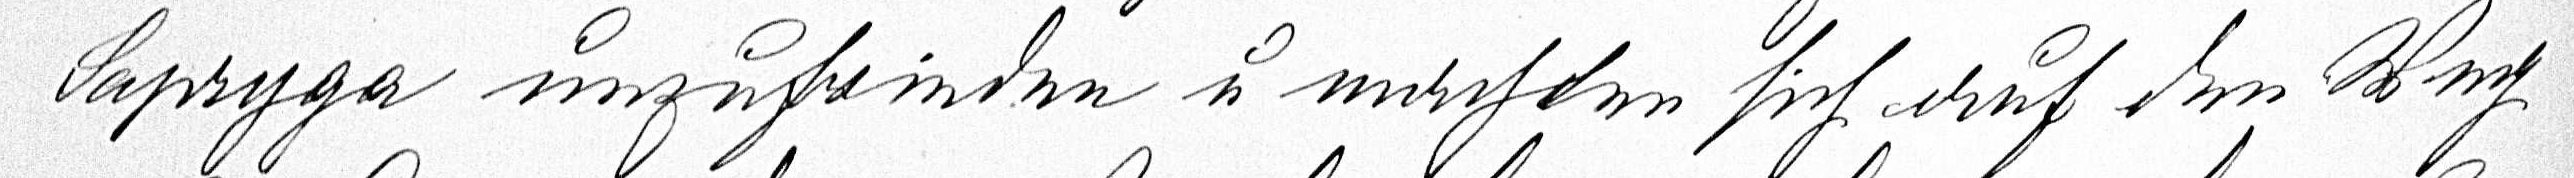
Sapryga unzufrieden u machten sich auf den Weg
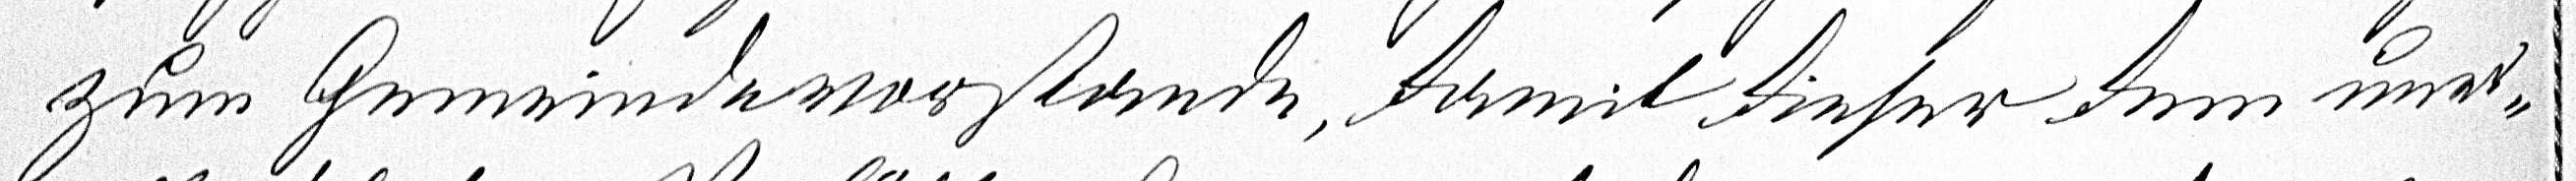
zum Gemeindevorstande, damit dieser dem uner¬
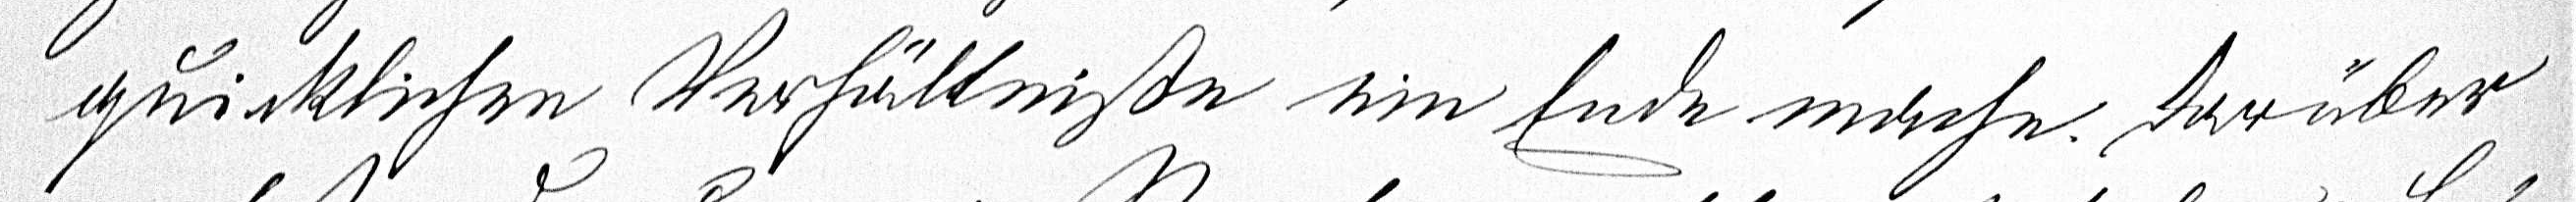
quicklichen [unedifying?] Verhältniße ein Ende mache. Darüber
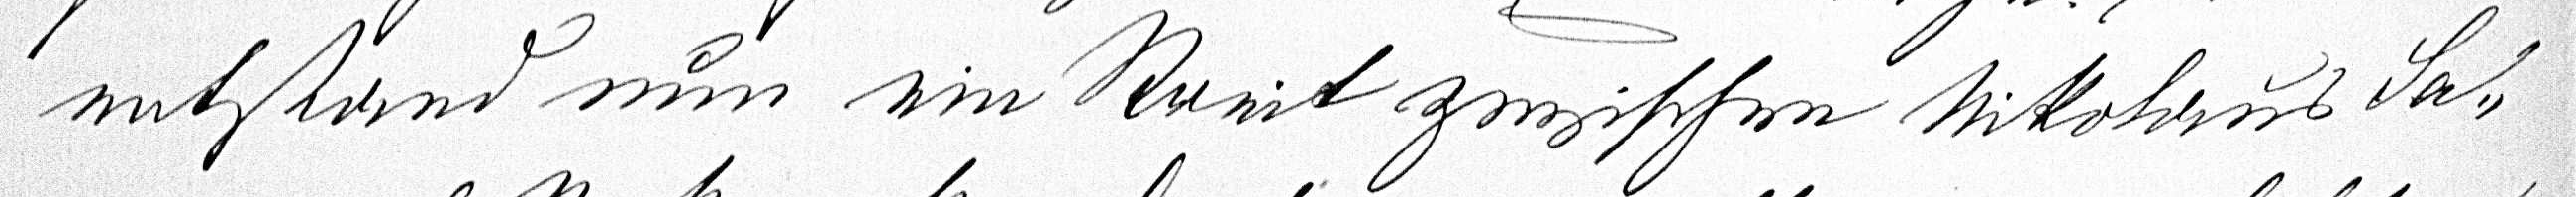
entstand nun ein Streit zwischen Nikolaus Sa¬
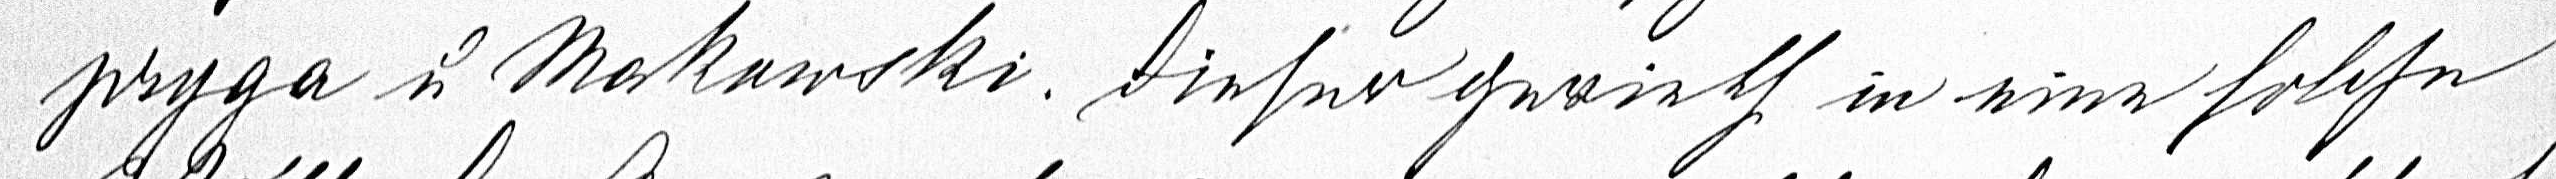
pryga u Makowski. Dieser gerieth in eine solche
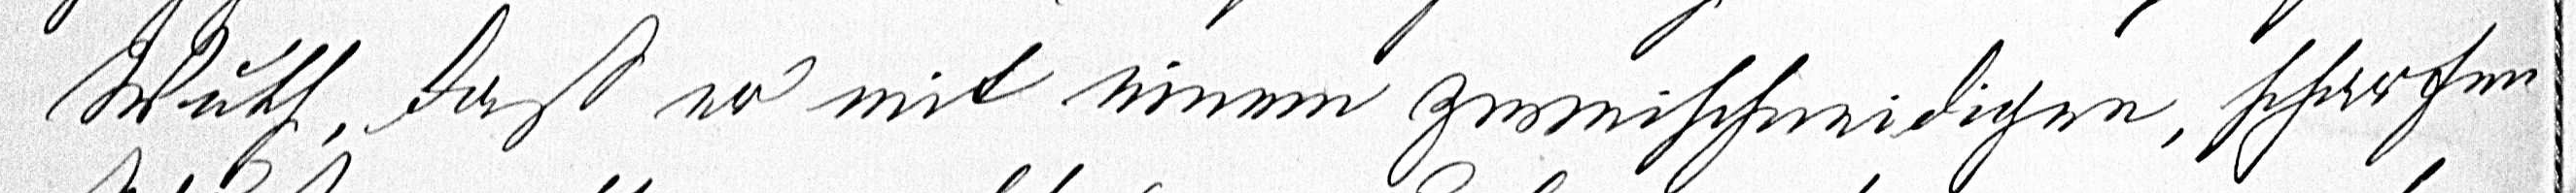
Wuth, daß er mit einem zweischneidigen, scharfen
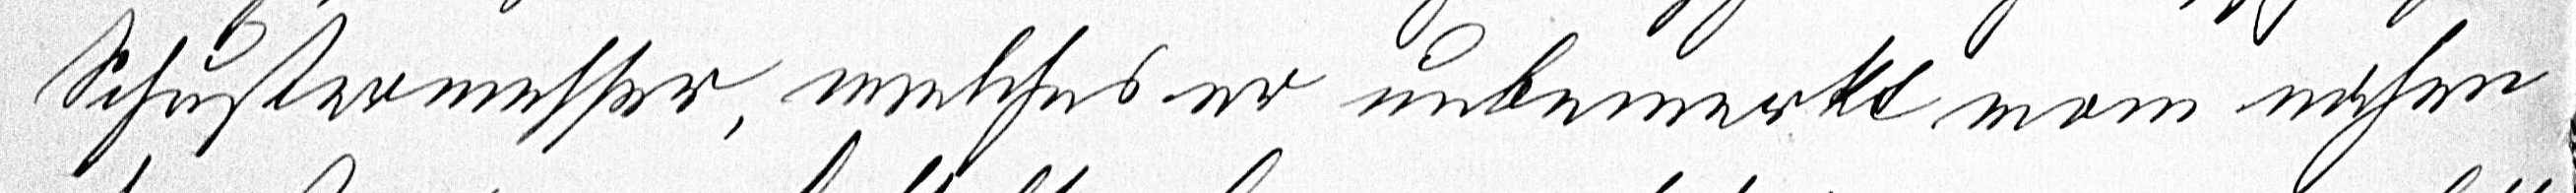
Schustermesser, welches er unbemerkt vom nahen
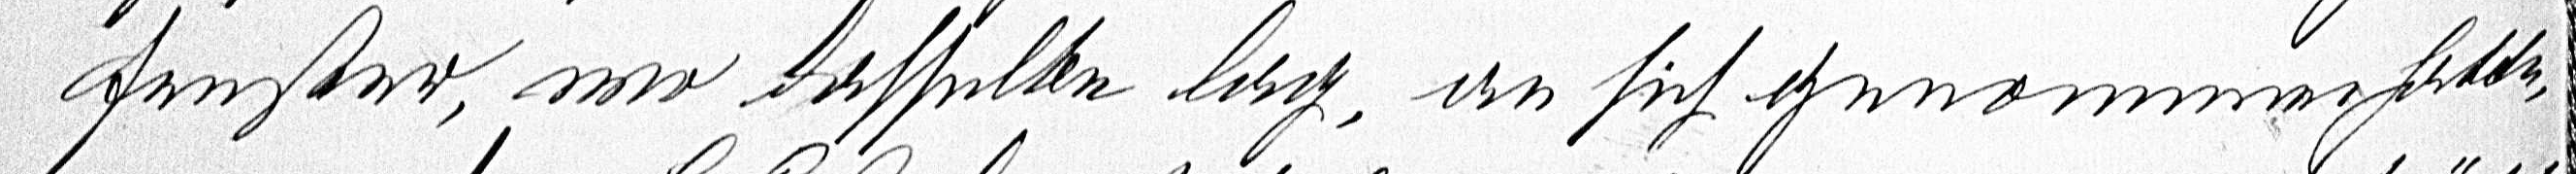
Fenster, wo dasselbe lag, an sich genommen hate,
